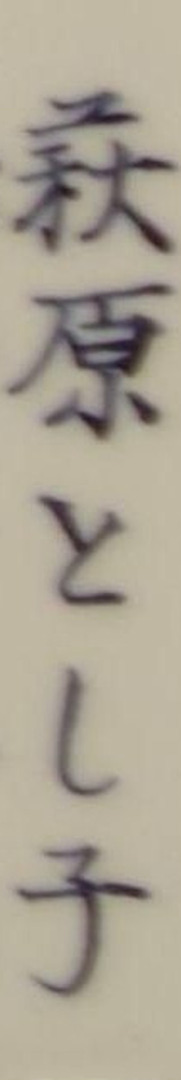萩原とし子
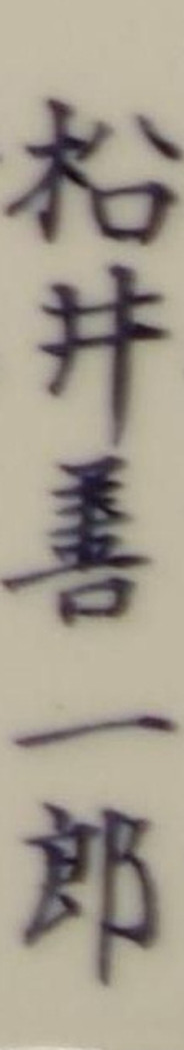松井善一郎
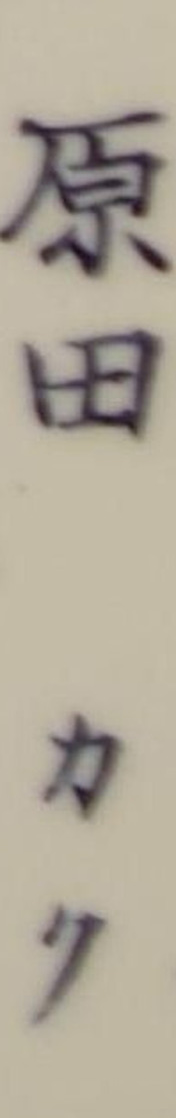原田カク
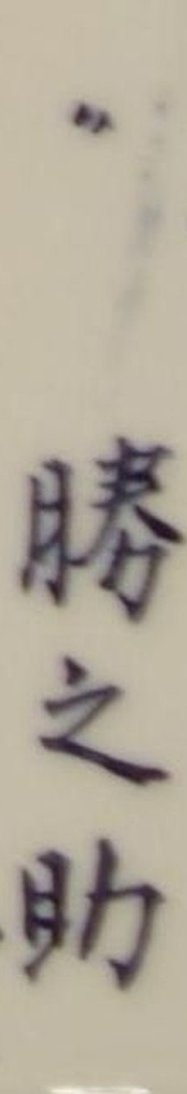勝之助
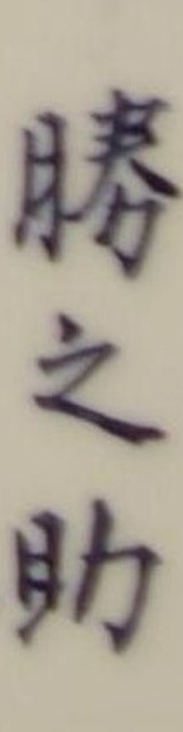勝之助
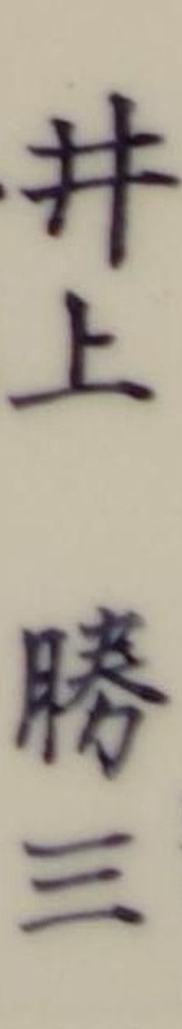井上勝三
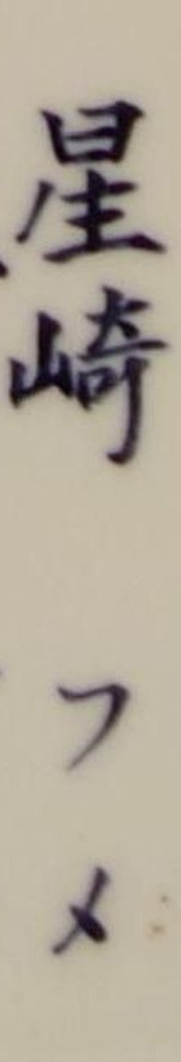星崎フメ
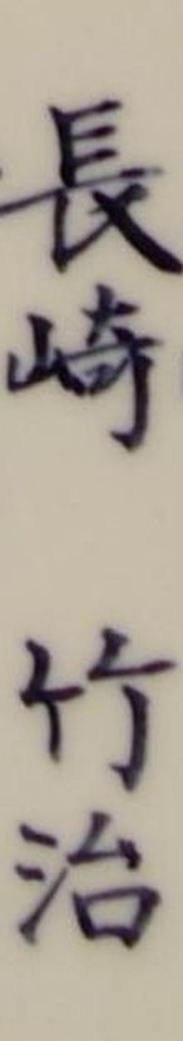長崎竹治
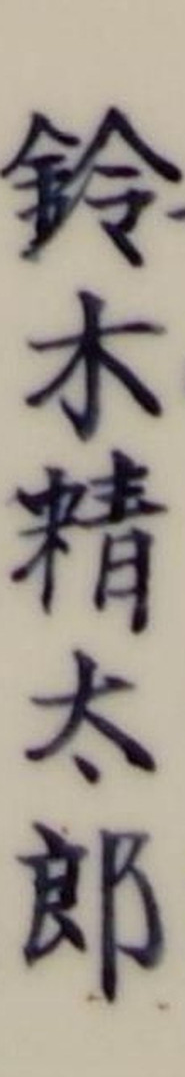鈴木精太郎
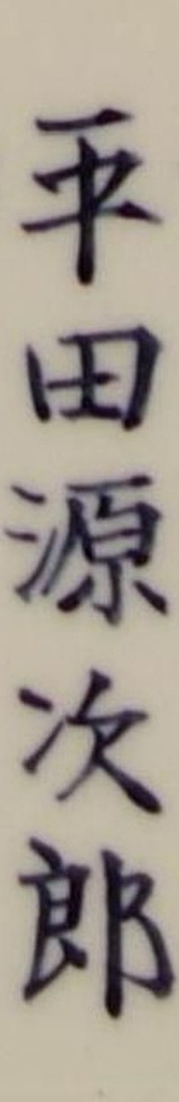平田源次郎
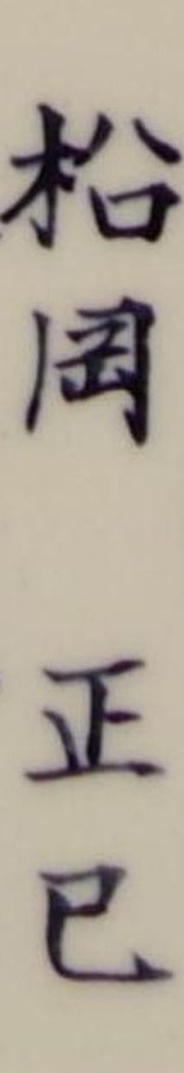松岡正巳
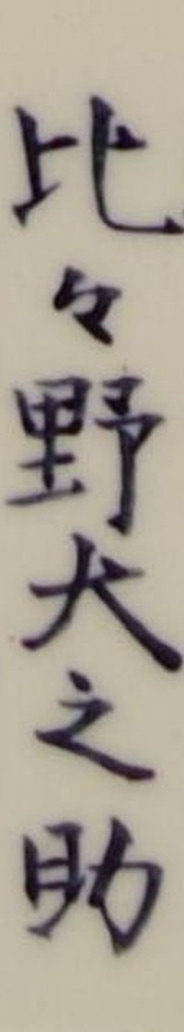比々野大之助
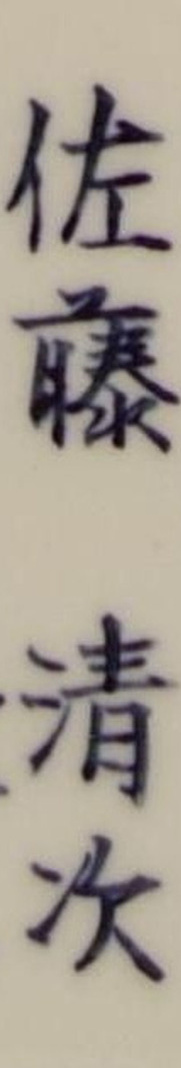佐藤清次
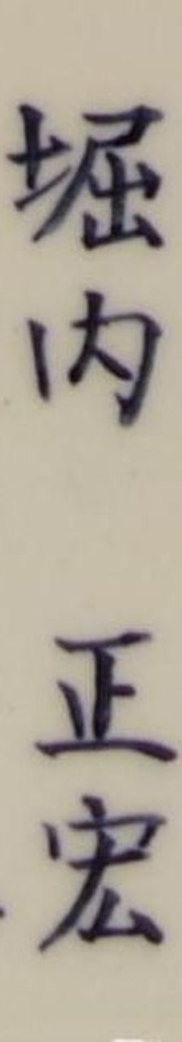堀内正宏
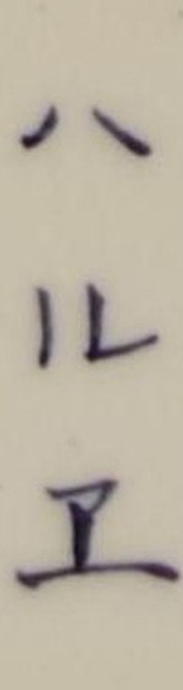ハルエ
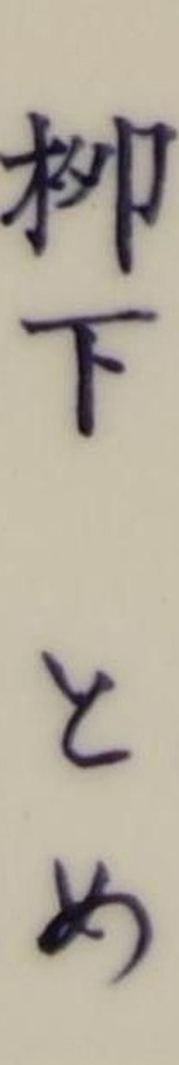柳下とめ
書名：M~S
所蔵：高野山金剛峯寺
